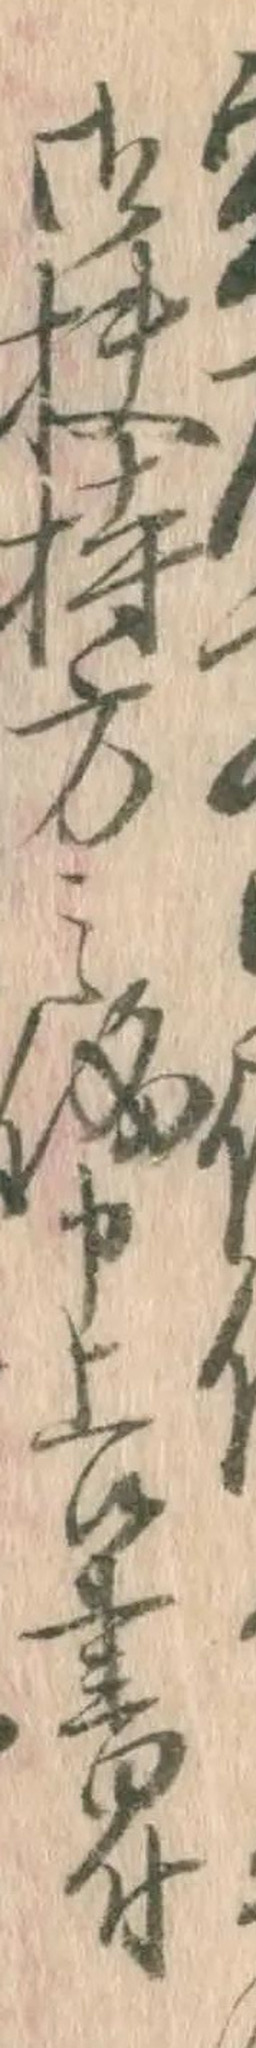御扶持方之儀申上候書付
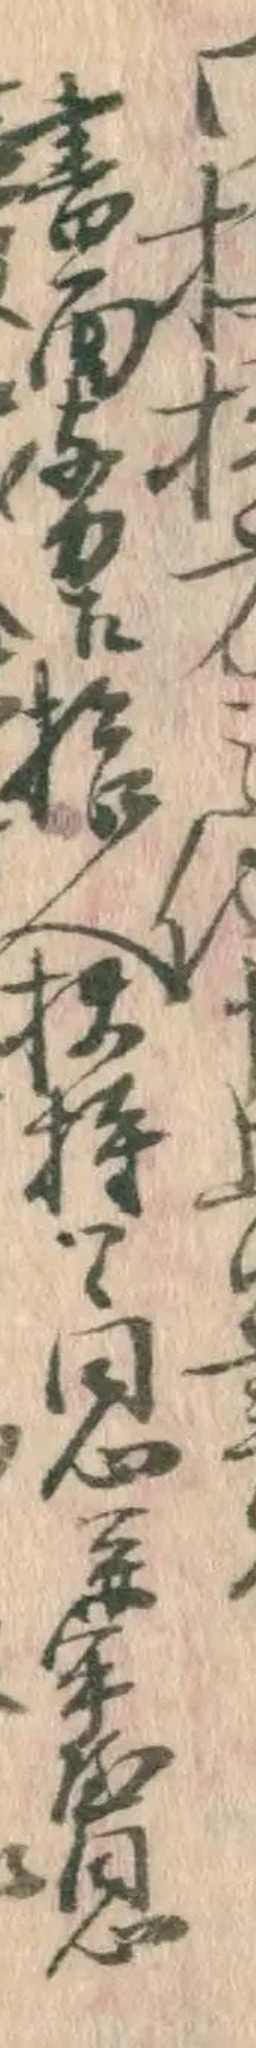書面与力え拾人扶持ツヽ同心幷牢屋同心
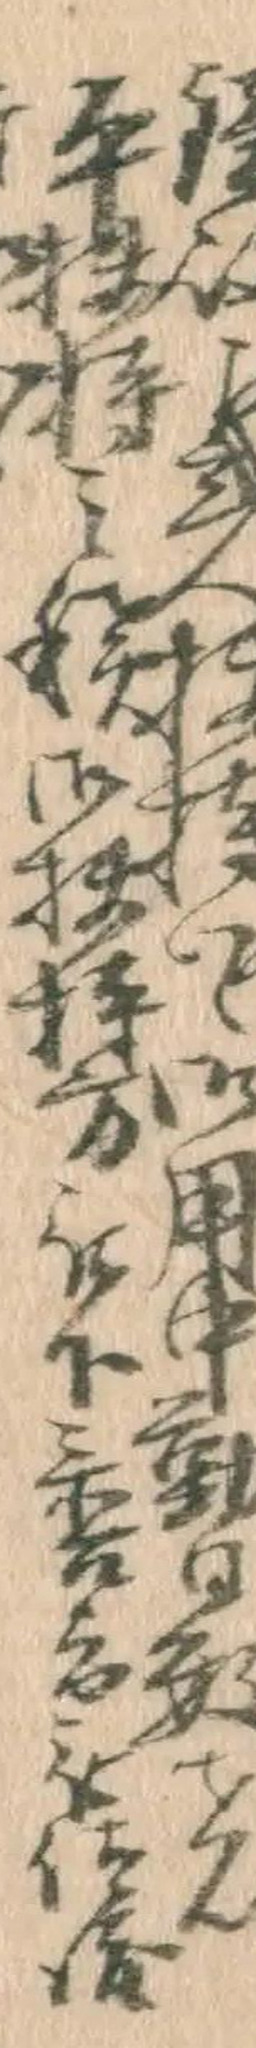平扶持之積御扶持方被下置候旨被仰渡
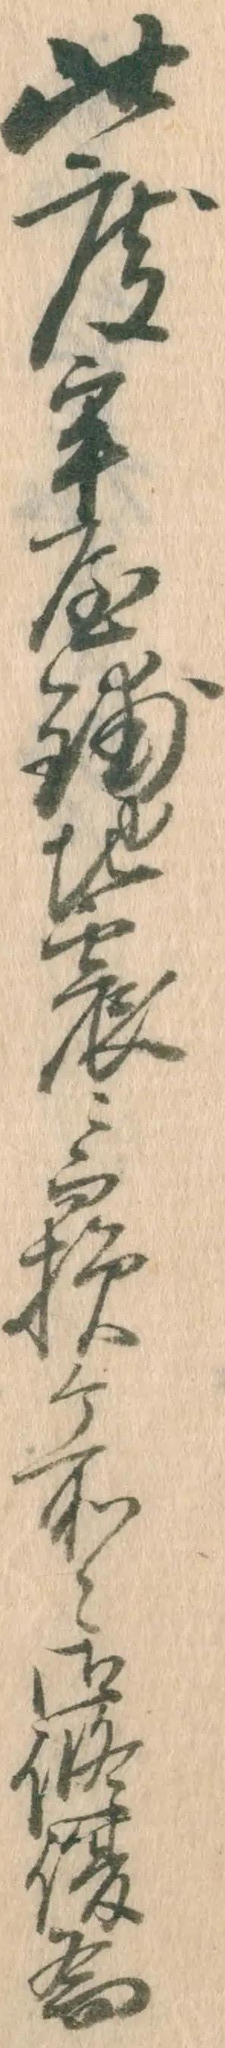此度牢屋鋪地震ニて損ケ所之御修復為
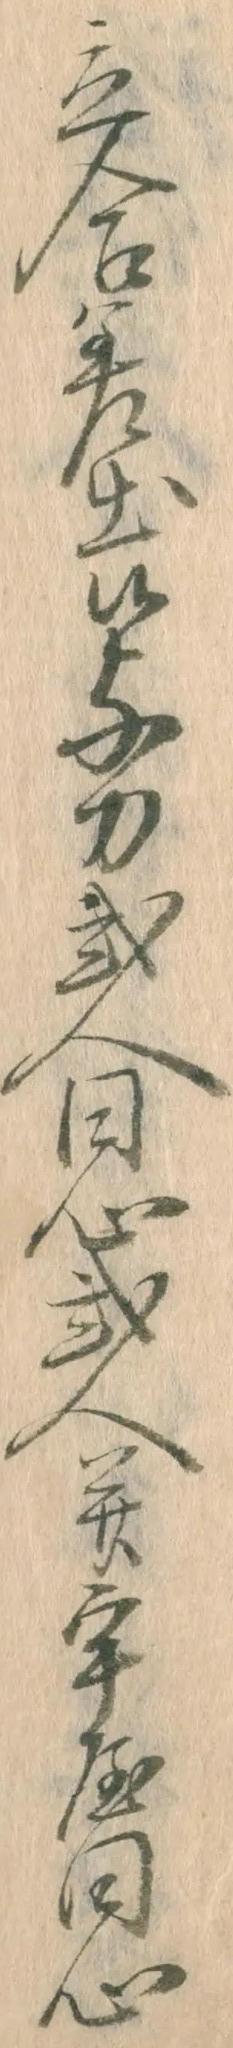立合指出候与力弐人同心弐人幷牢屋同心

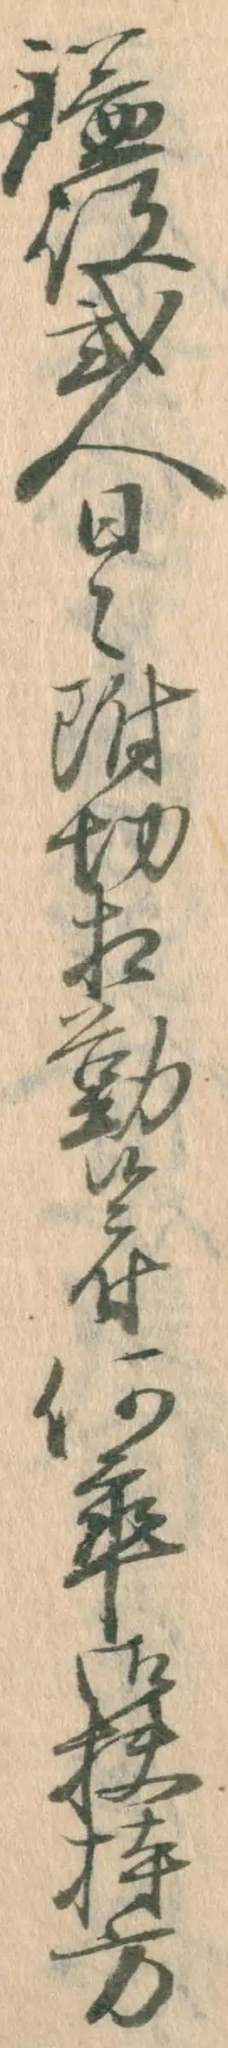鎰役弐人日〻附切相勤候ニ付何卒御扶持方
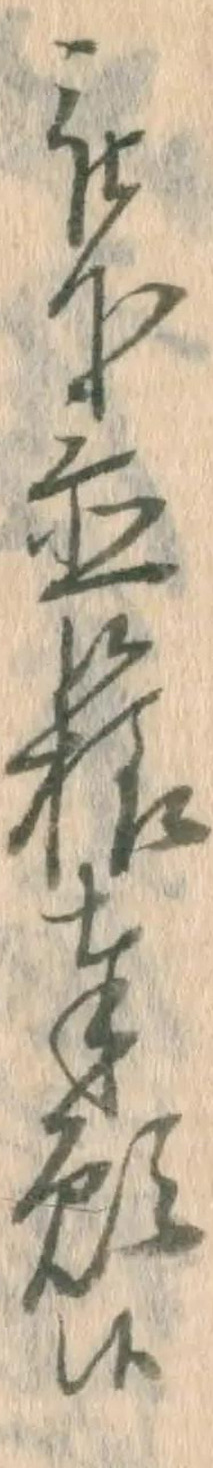被下置候様奉願候
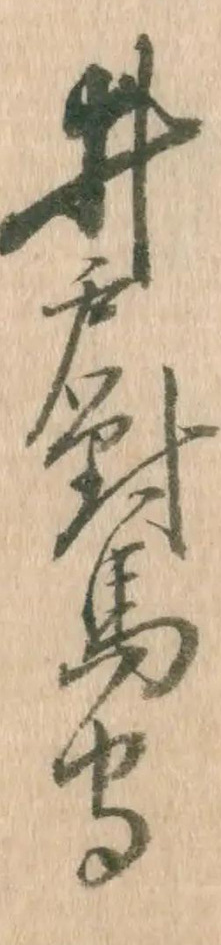辰二月井戸対馬守
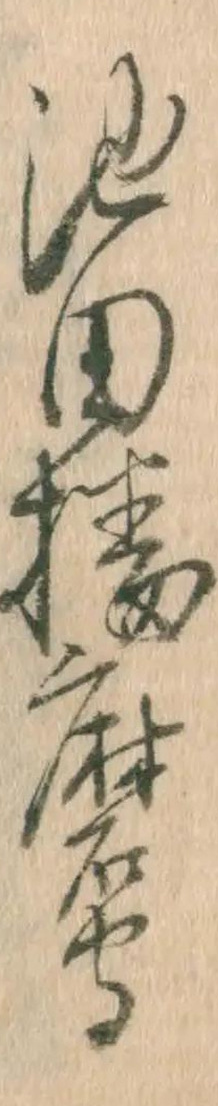池田播磨守

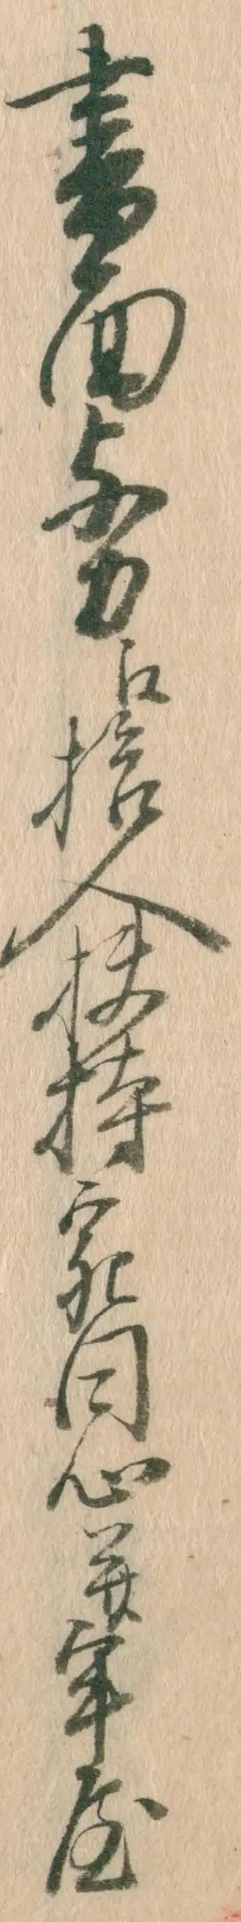書面与力え拾人扶持宛同心幷牢屋
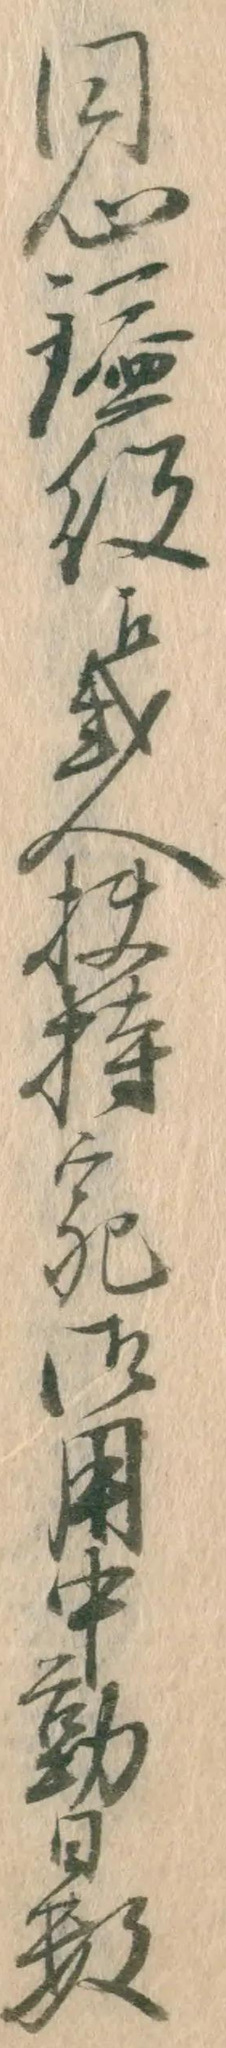同心鎰役え弐人扶持宛御用中勤日数
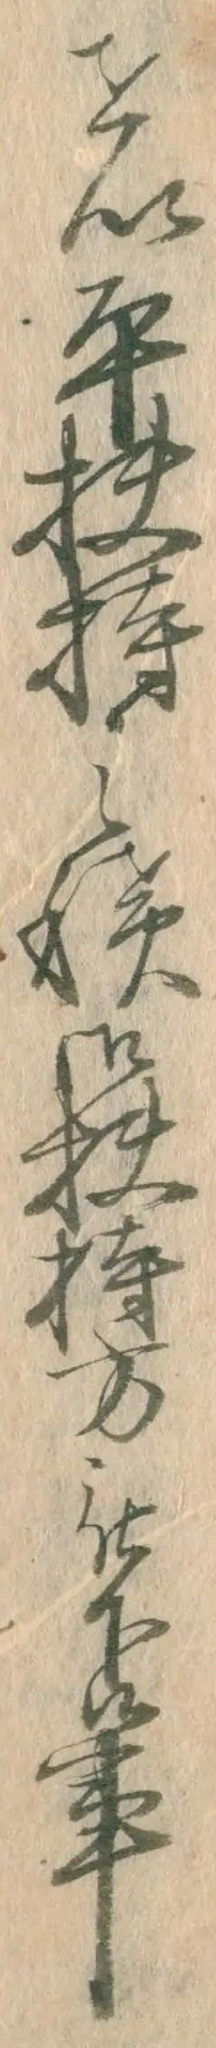を以平扶持之積御扶持方被下候事

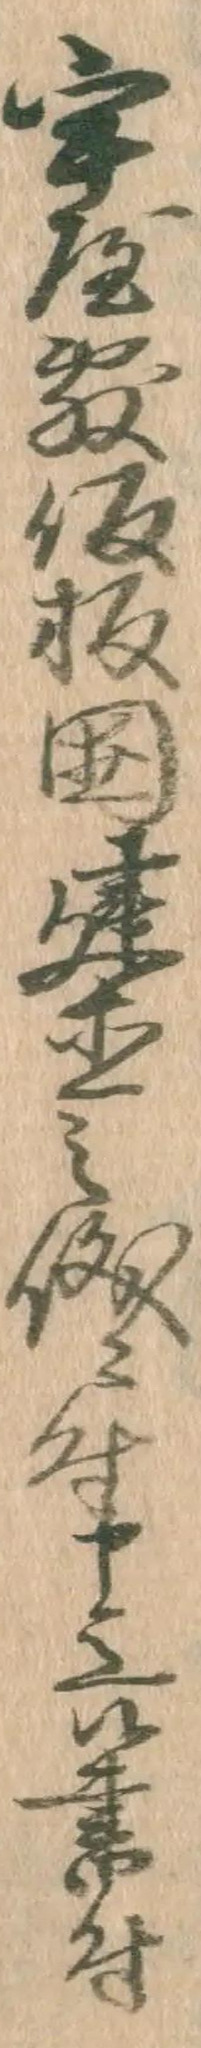│牢屋敷仮板囲建直之儀ニ付申上候書付
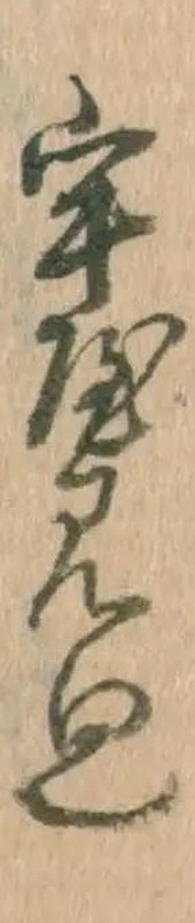│牢屋見廻
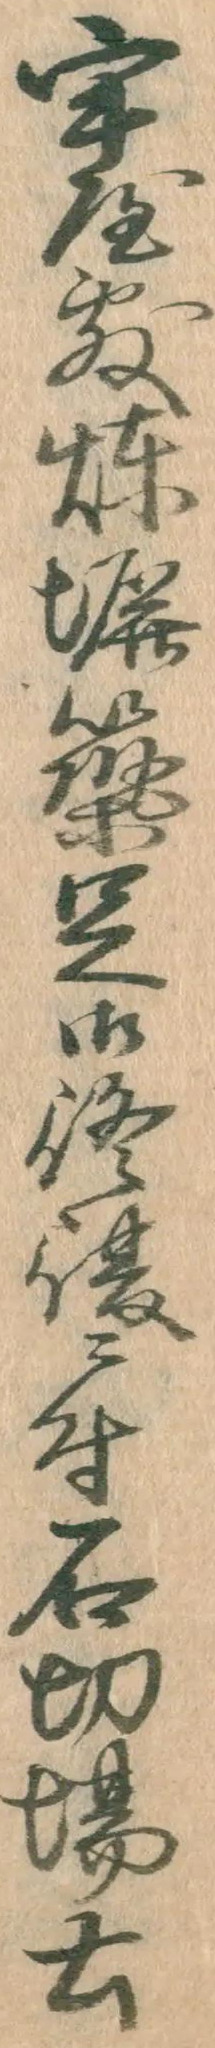牢屋敷煉塀築足御修復ニ付石切場土
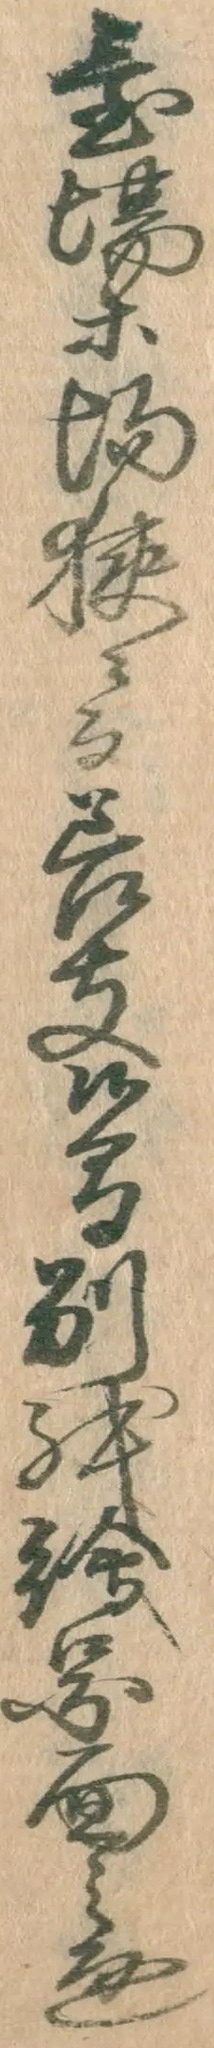台場等隔狭ニて差支候間別紙絵図面之通
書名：七十冊物類集 71巻. [44] 四十三 牢屋敷御普請御修覆地震ニ付骨折候牢屋掛御褒美之部
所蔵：国立国会図書館 National Diet Library, JAPAN
